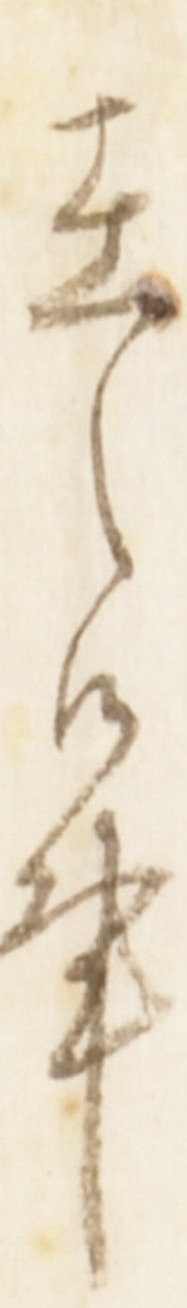在之候事
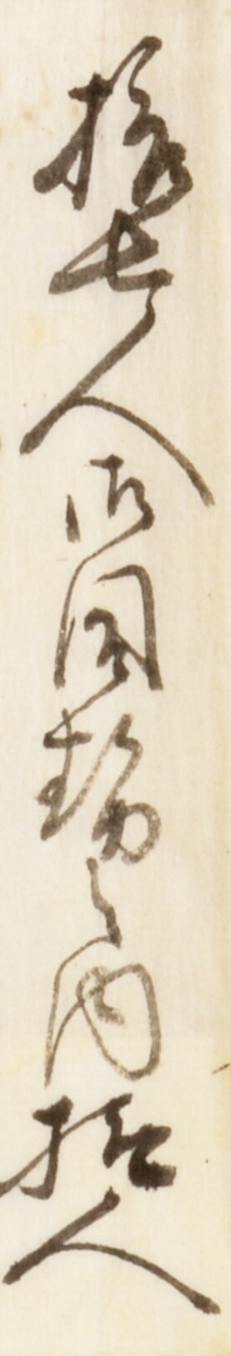拾七人御同勢之内拾人
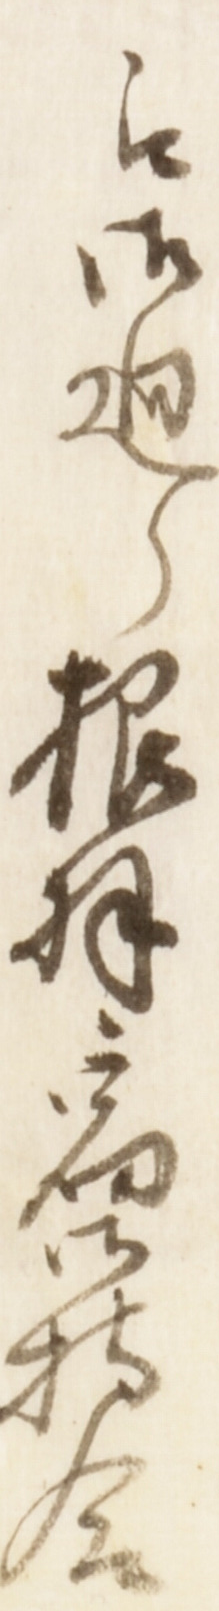え御廻り根羽宿御持合
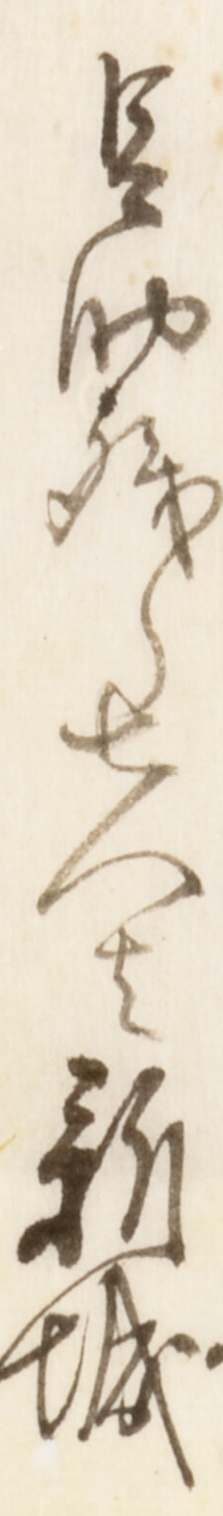足助残り七人は新城
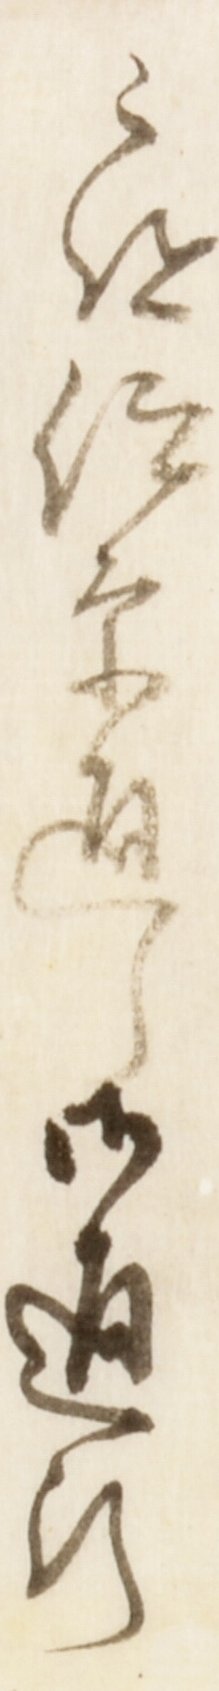被遊伊原通り御通行
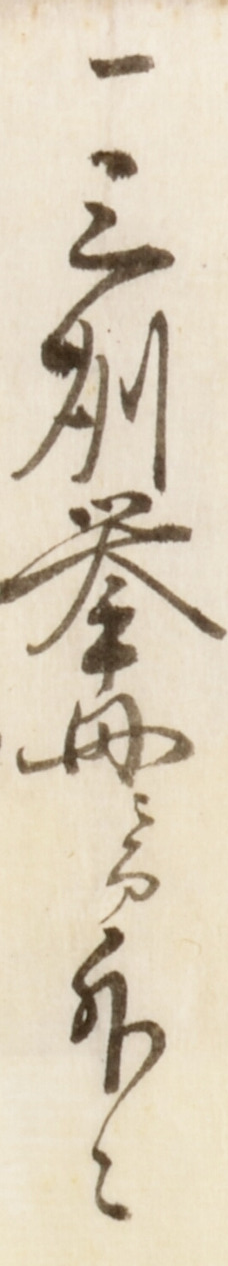一三州挙母ニ而外ニ
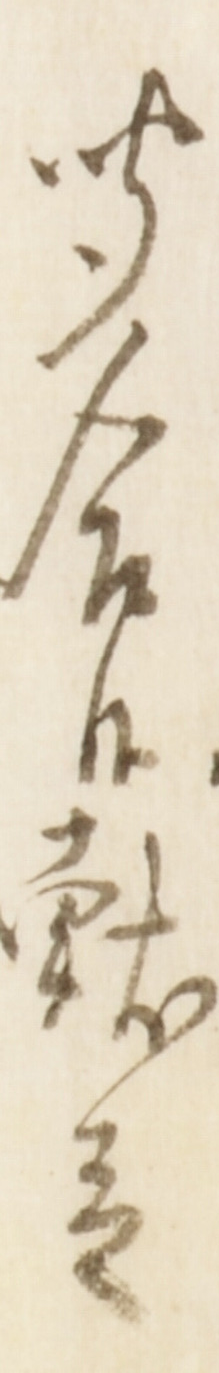聞合候献立

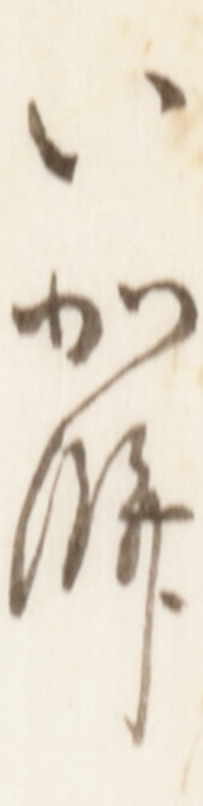いか餅
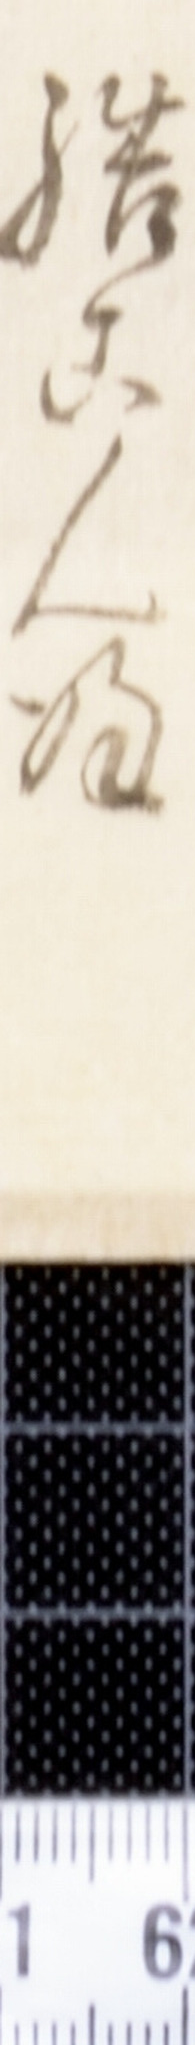結こんふ
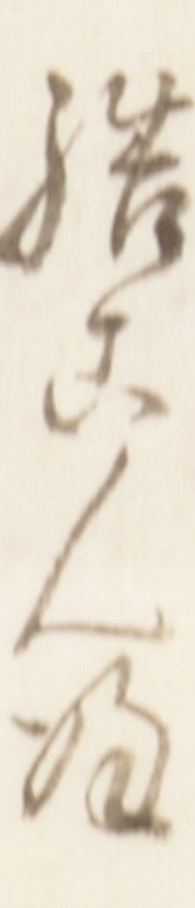結こんふ
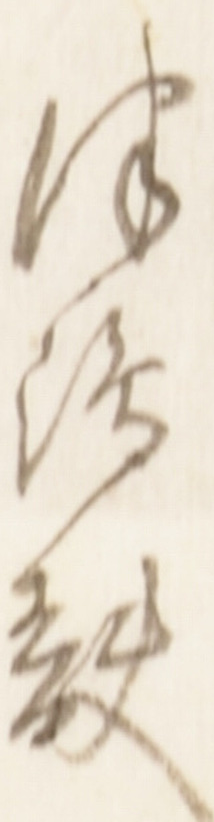津嶋麩
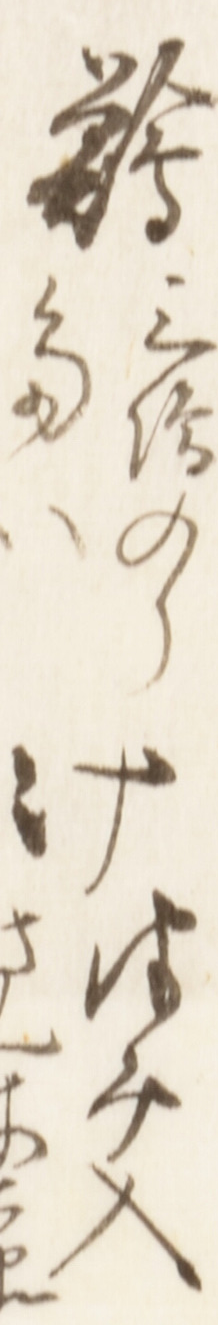鱠三嶋のり汁つみ入
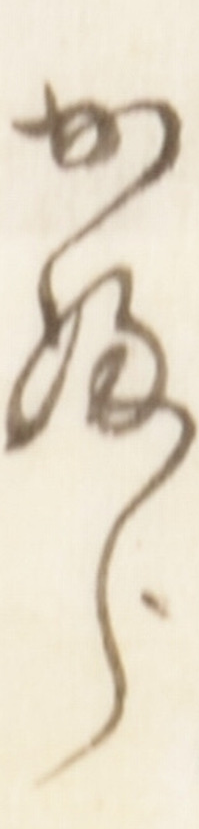かふら
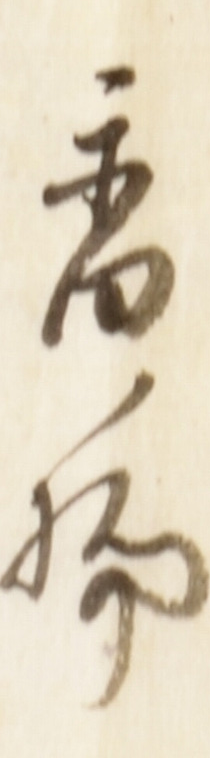香ノ物
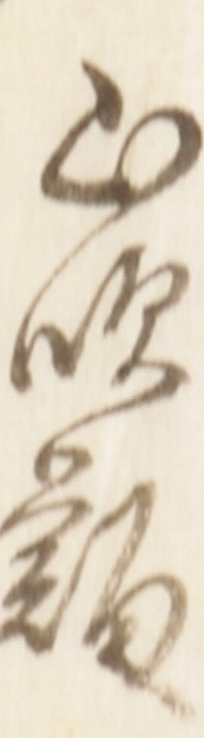山吹鯔
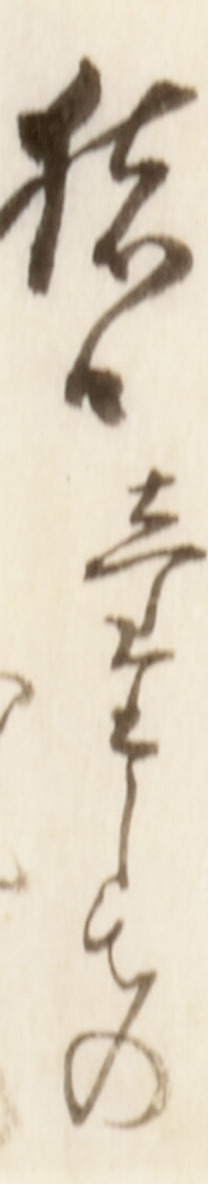猪口したしもの
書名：（諸事控）
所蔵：伊那市立高遠町図書館・合同会社AMANE
